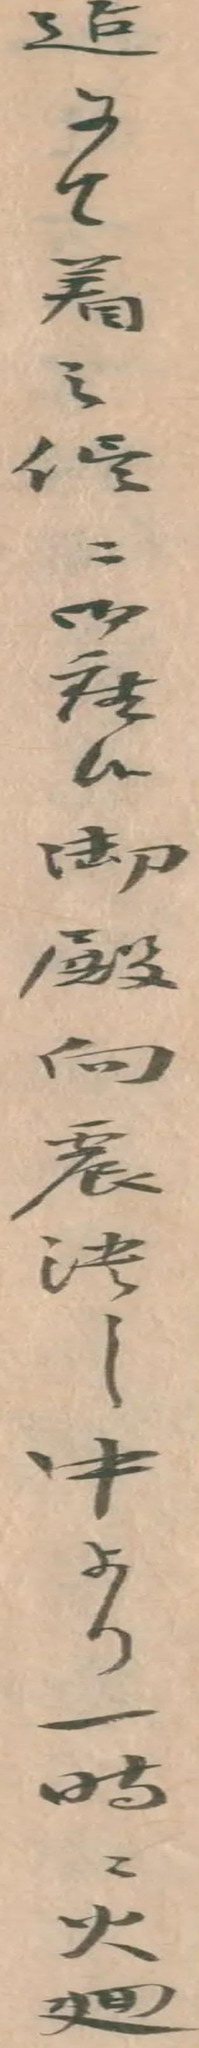迄にて着之儘二御座候御殿向震潰し中より一時二火廻
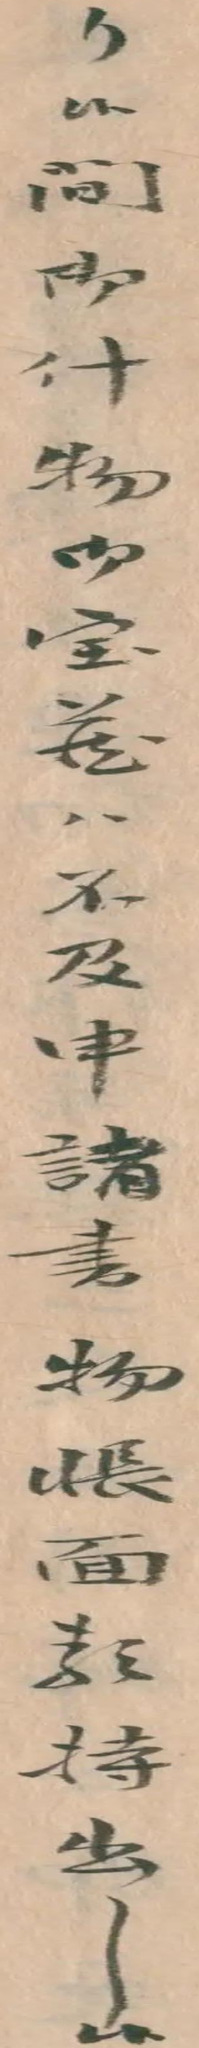り候間御什物御宝蔵ハ不及申諸書物帳面類持出し候
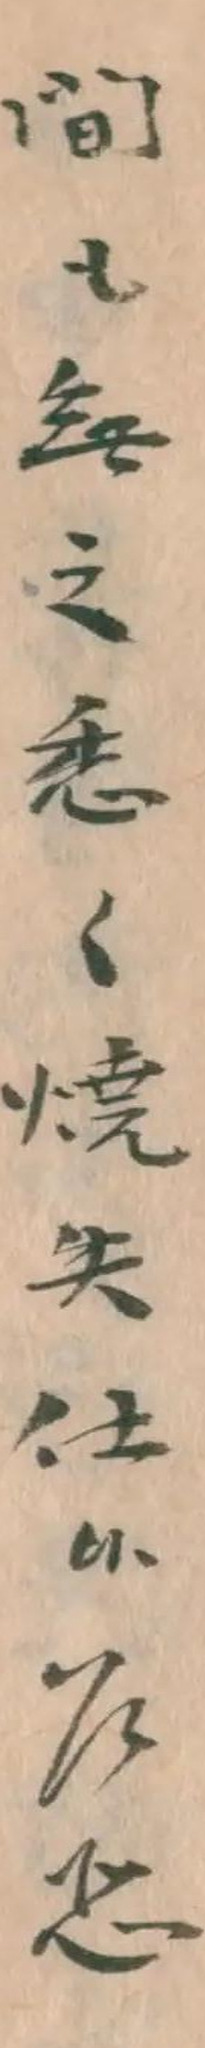間も無之悉く焼失仕候乍恐
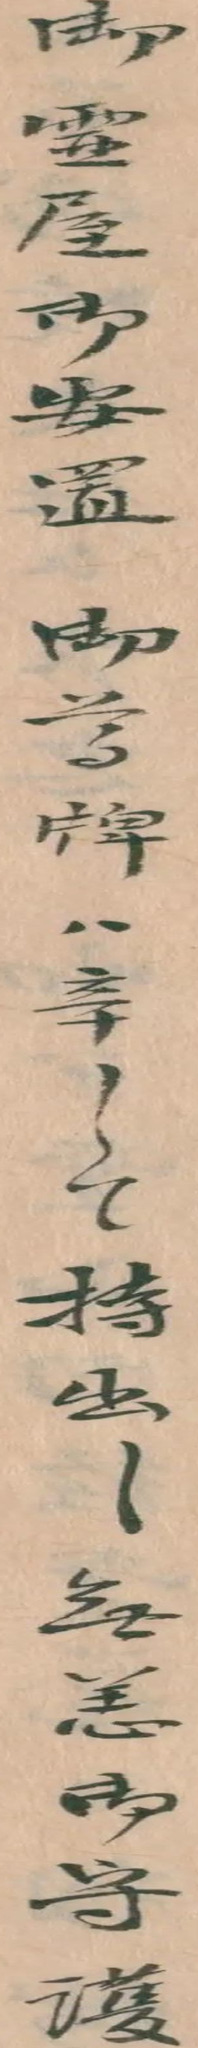御霊屋御安置御尊牌ハ辛して持出し無恙御守護
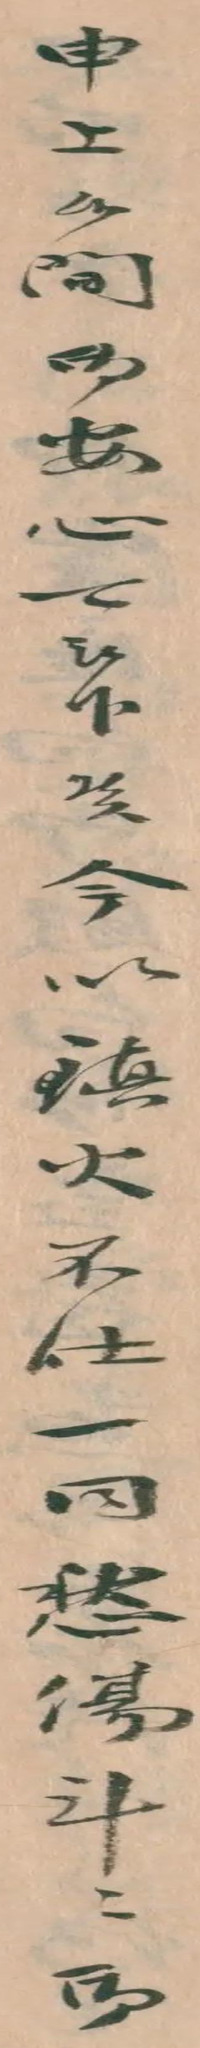申上候間御安心可被下候今以鎮火不仕一同愁傷斗二御
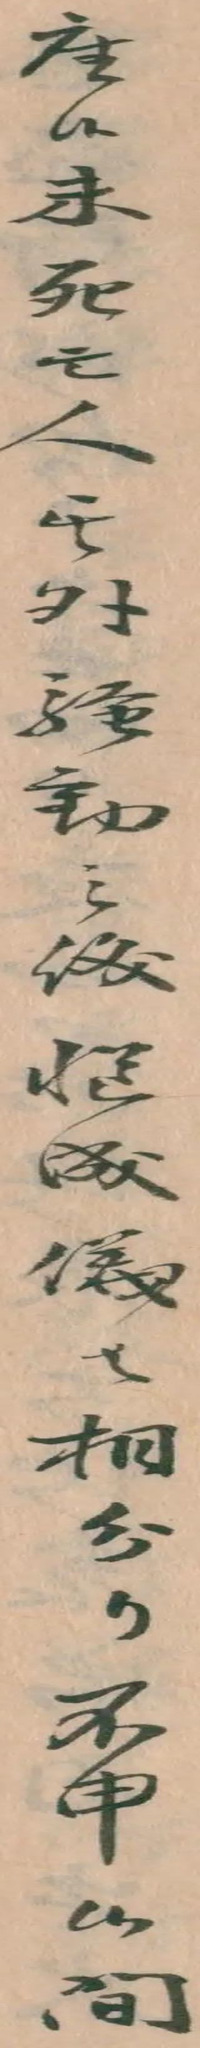座候未死亡人其外騒動之儀慥成儀者相分り不申候間
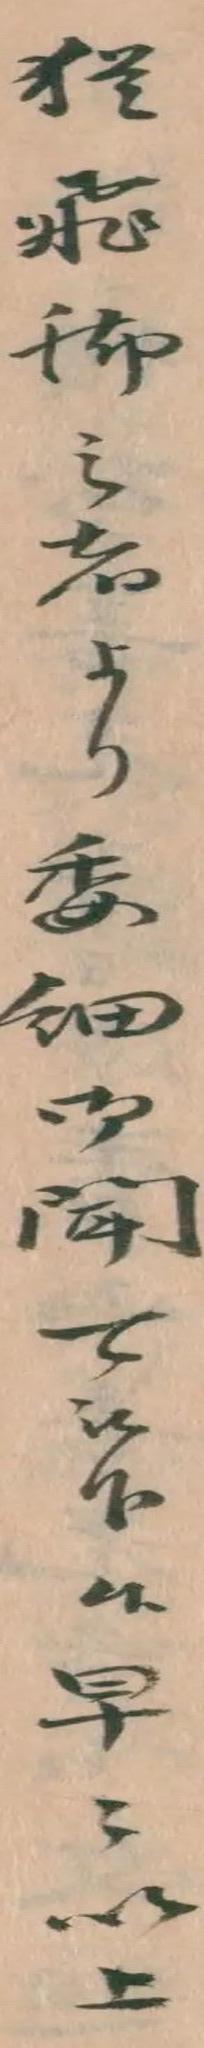猶飛脚之者ゟ委細御聞可被下候早々以上
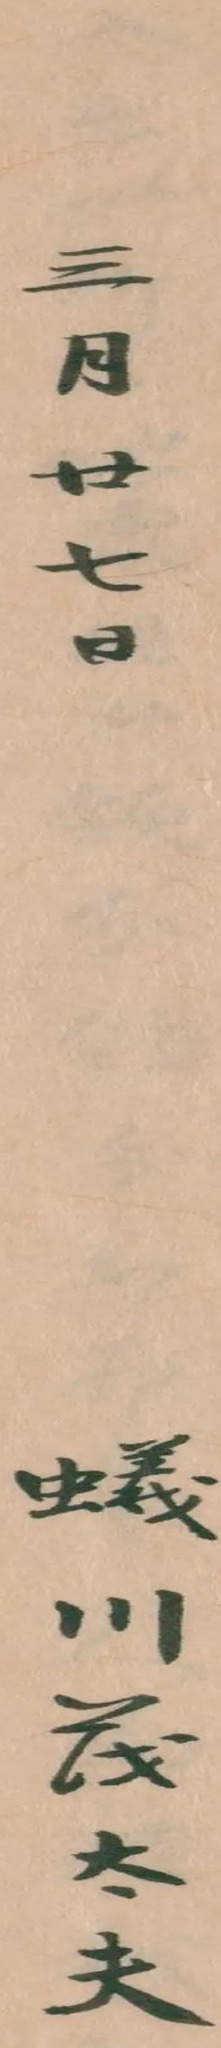三月廿七日蟻川茂太夫
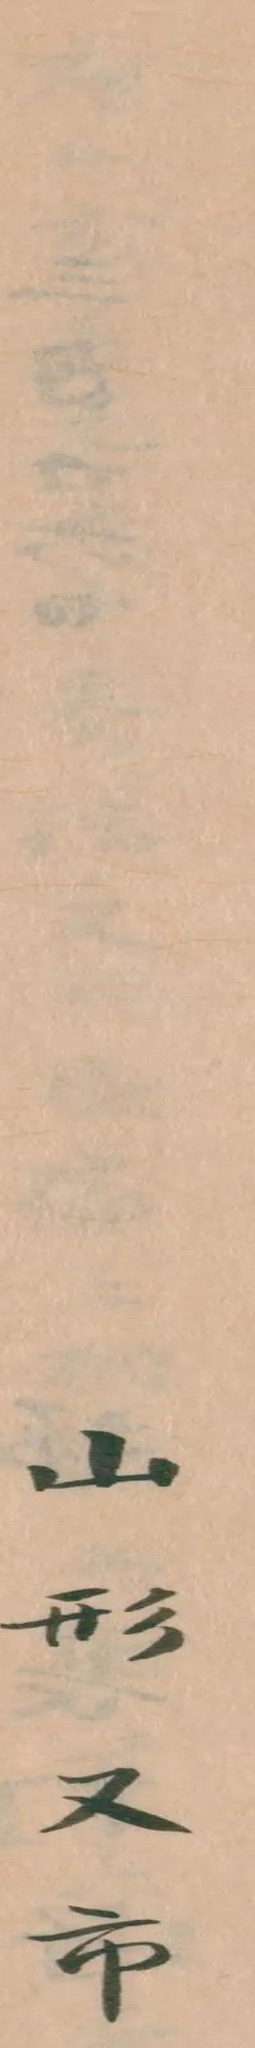山形又市
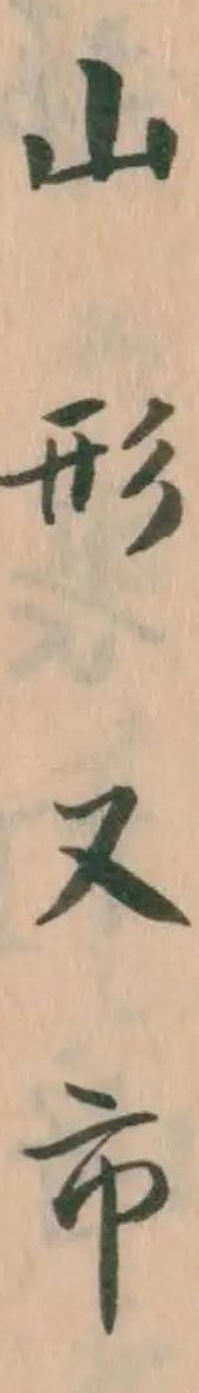山形又市
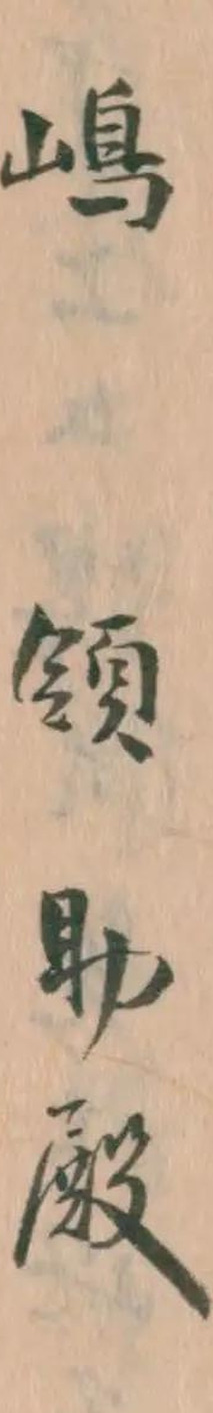嶋領助殿
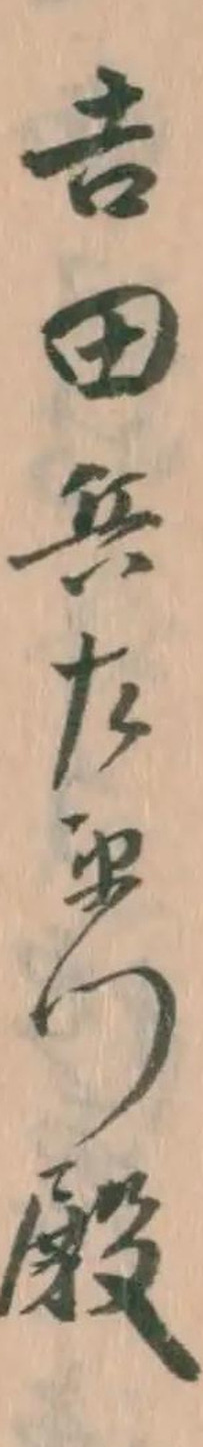吉田兵左衛門殿
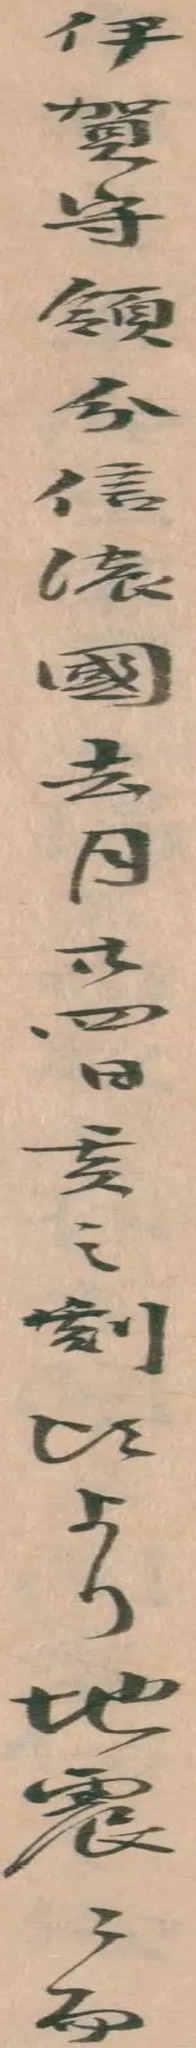伊賀守領分信濃国去廿四日亥之刻比より地震ニ而
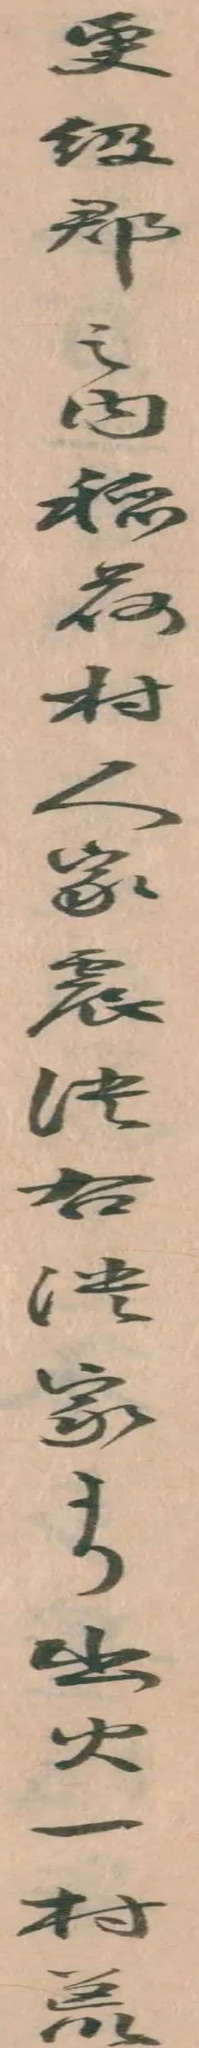更級郡之内稲荷村人家震潰右潰家より出火一村荒
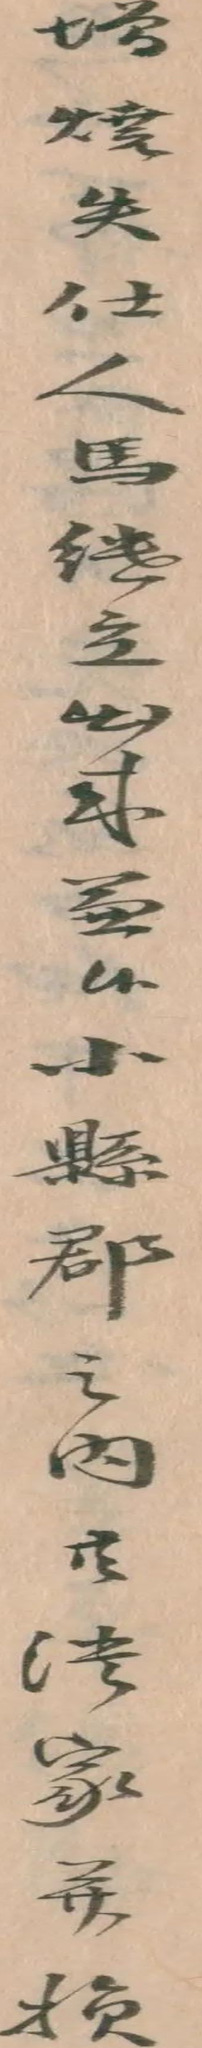増焼失仕人馬継立出来兼候小県郡之内共潰家并損
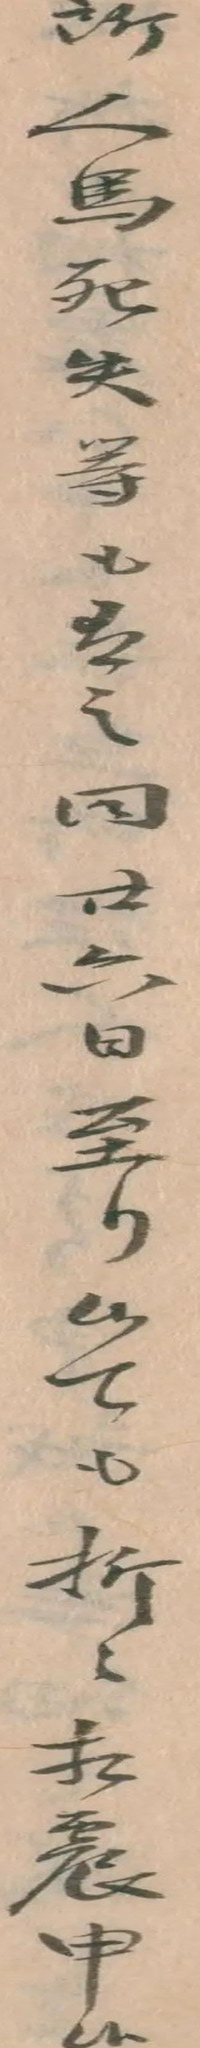所人馬死失等も有之同廿六日至り候而も折々相震申候
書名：地災撮要. 巻3(地震之部)-巻4(噴火之部)
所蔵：国立国会図書館 National Diet Library, JAPAN
